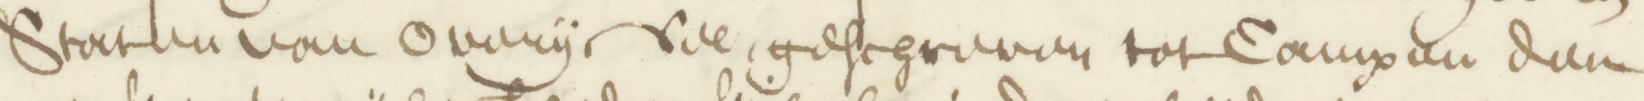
Staten van Overijssel, geschreven tot Campen den
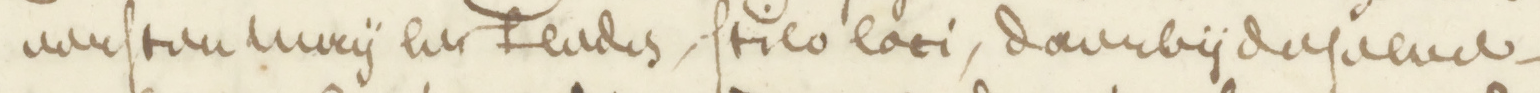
eersten Maij lestleen, stilo loci, daerbij deselve
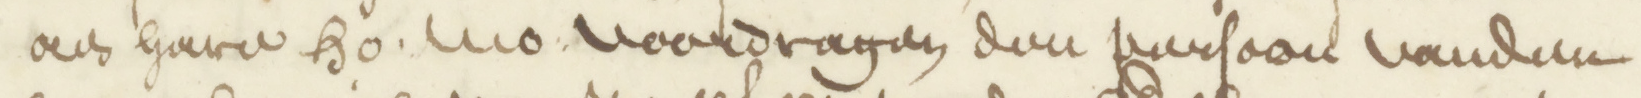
aen hare Ho:Mo: voordragen den persoon vanden
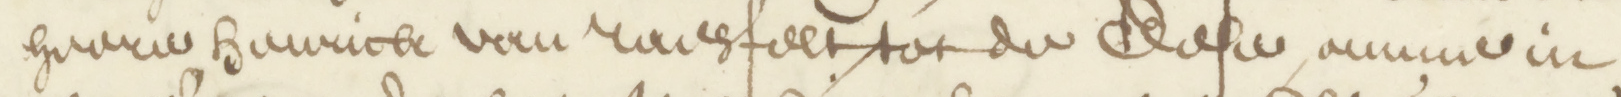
heere henrick van Raesfelt tot de Eese, omme in
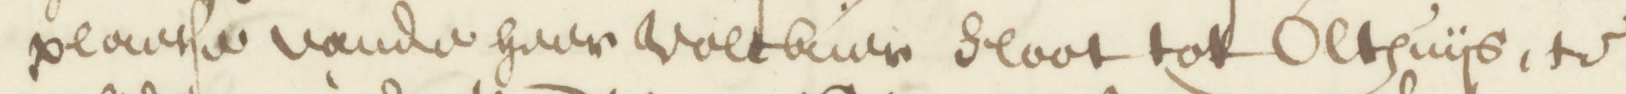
plaetse vande heer Volckier Sloot tot Olthuijs, te
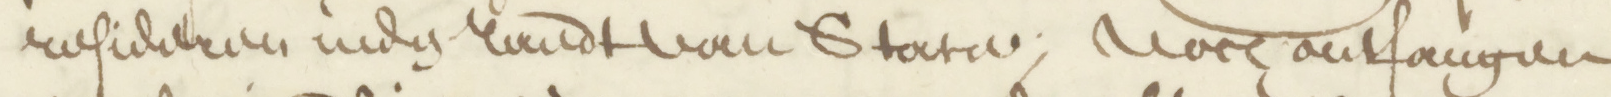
resideren inden Raedt van State; Noch ontfangen
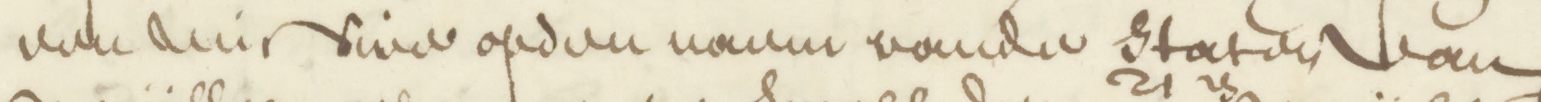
een Missive opden naem vande Staten van
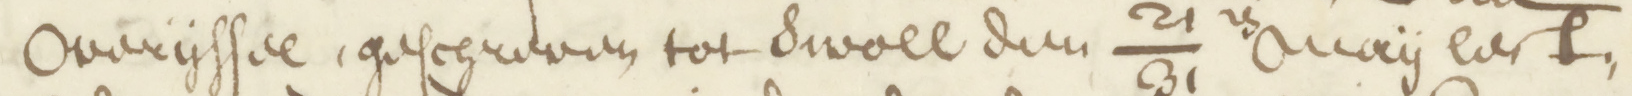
Overijssel, geschreven tot Swoll den 21/31en Maij lest,,
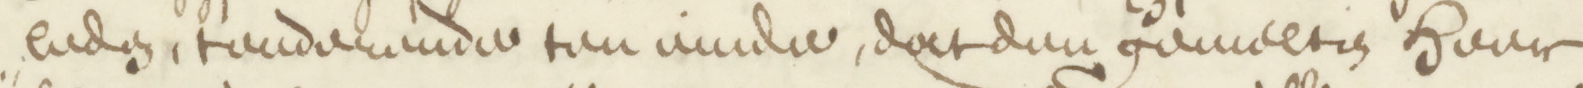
„leden, tenderende ten einde, dat den gemelten Heer
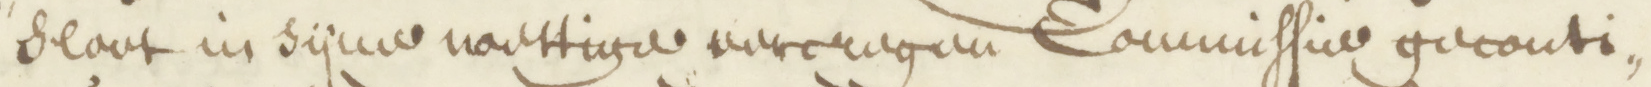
Sloot in sijne wettige vercregen Commissie geconti,,
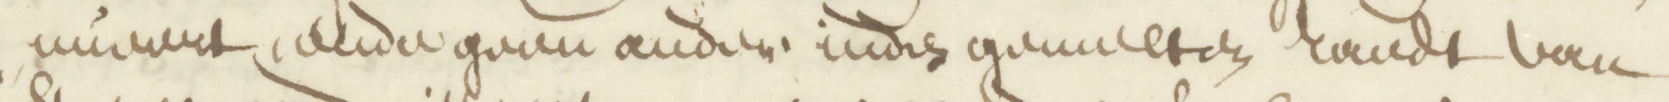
„nueert, ende geen ander inden gemelten Raedt van
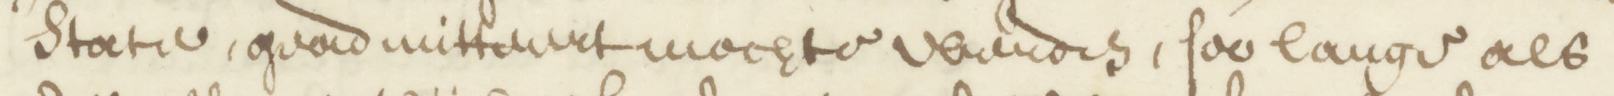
State, geadmitteert mochte werden, soo lange als
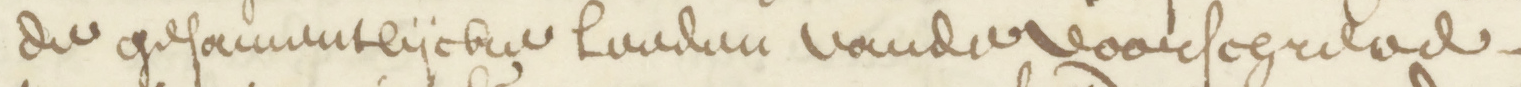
de gesamentlijcke leeden vande voorschreve
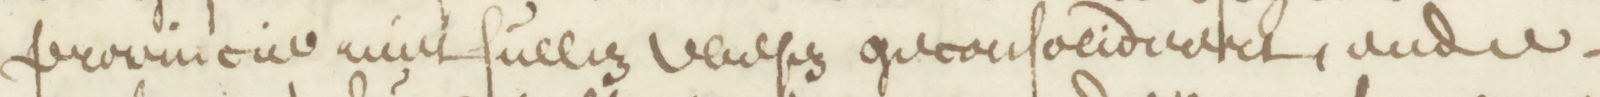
provincie niet sullen wesen geconsolideert, ende
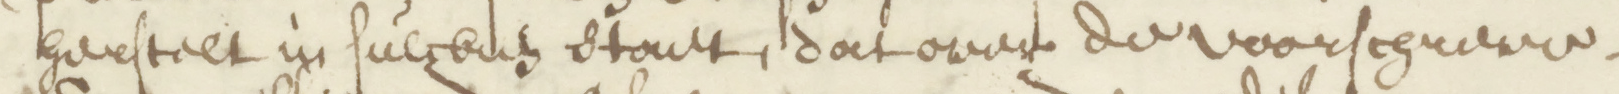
herstelt in sulcken staet, dat over de voorschreve
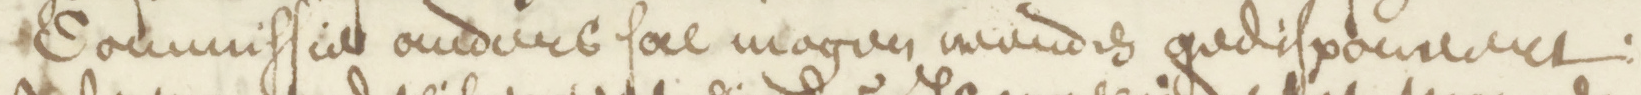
Commissie anders sal mogen werden gedisponeert:
